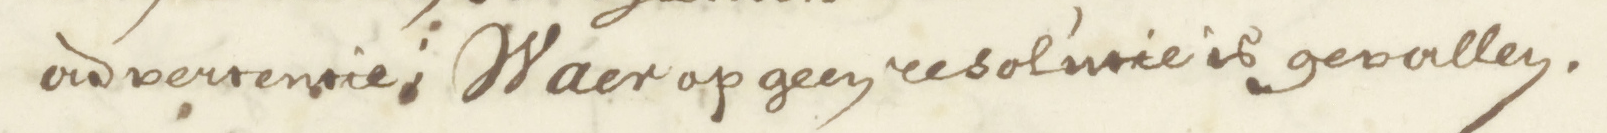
advertentie; Waer op geen resolutie is gevallen.
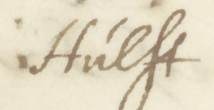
Hulst
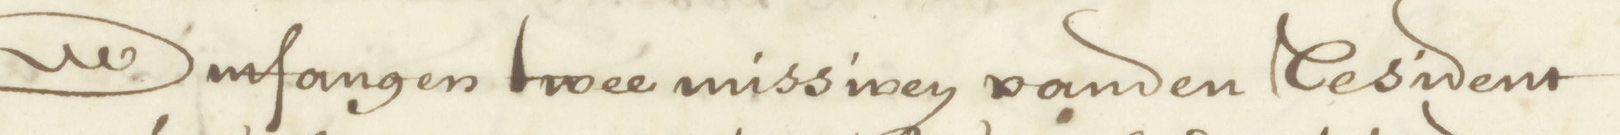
Ontfangen twee missiven vanden Resident
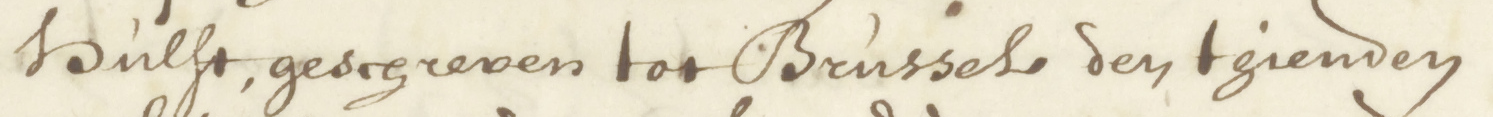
Hulst, geschreven tot Brussel den thienden
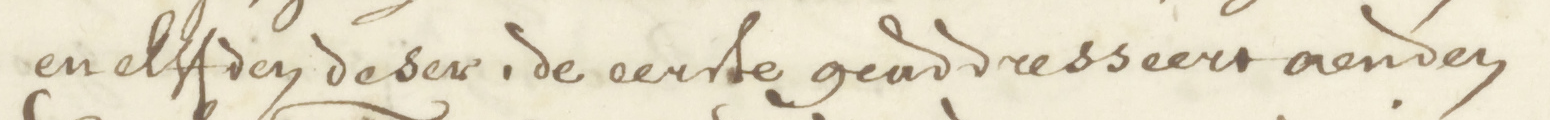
en elffden deser, de eerste geaddresseert aenden
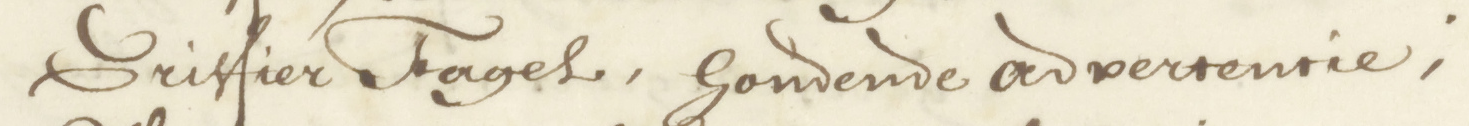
Griffier Fagel, houdende advertentie,
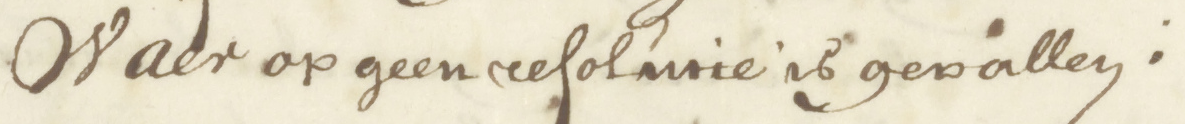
Waer op geen resolutie is gevallen.
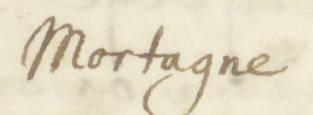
Mortagne
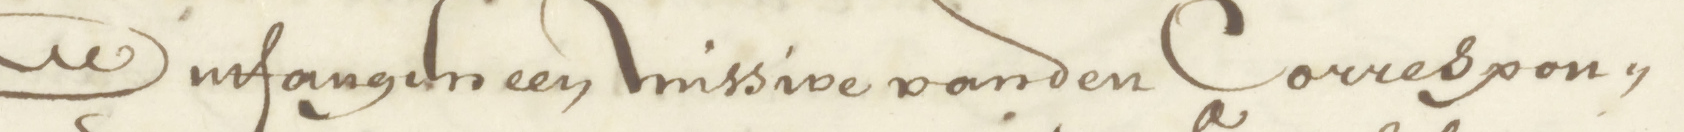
Ontfangen een missive vanden Correspon„
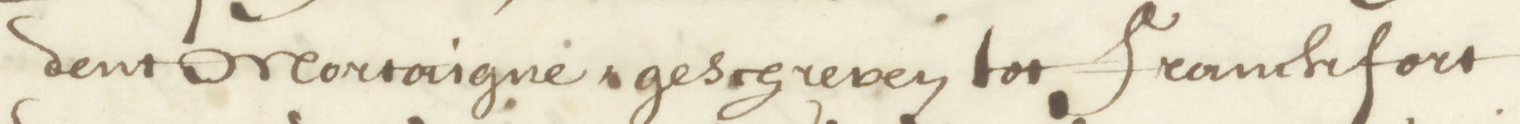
dent Mortaigne, geschreven tot Franckfort
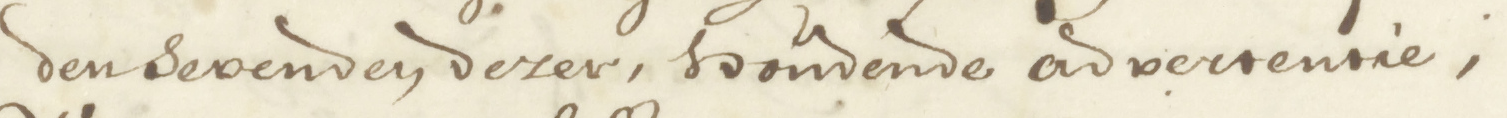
den sevenden dezer, houdende advertentie,
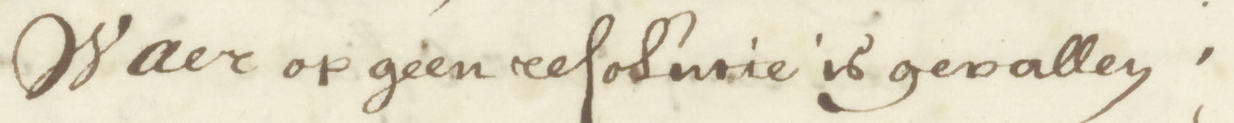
Waer op geen resolutie is gevallen.
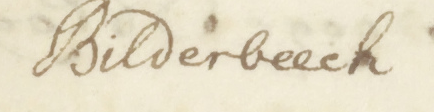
Bilderbeeck
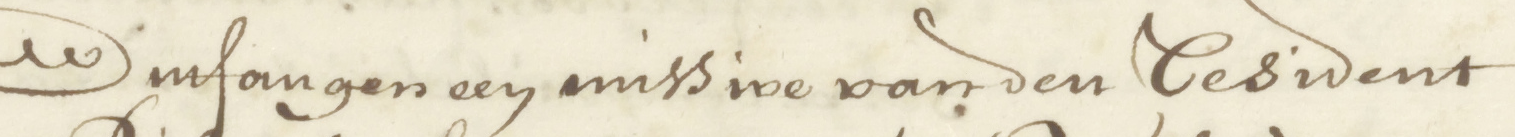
Ontfangen een missive vanden Resident
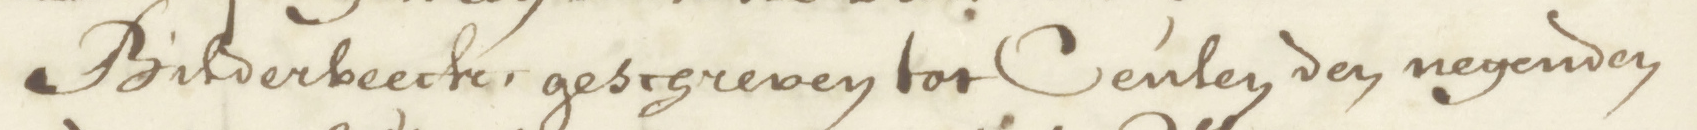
Bilderbeeck, geschreven tot Ceulen den negenden
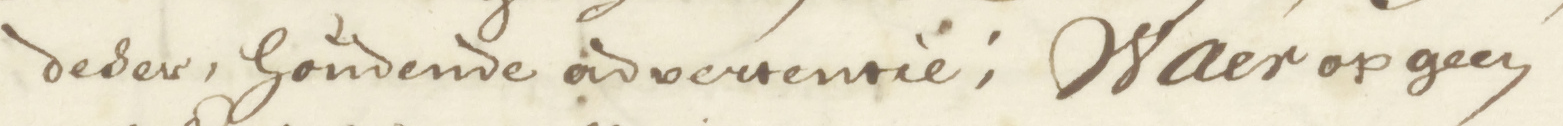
deser, houdende advertentie; Waer op geen
